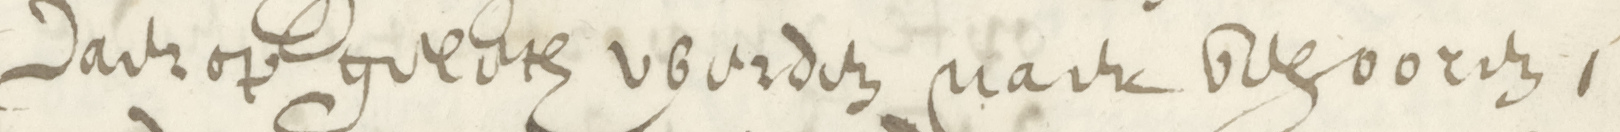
daerop geleth werden naer behooren.
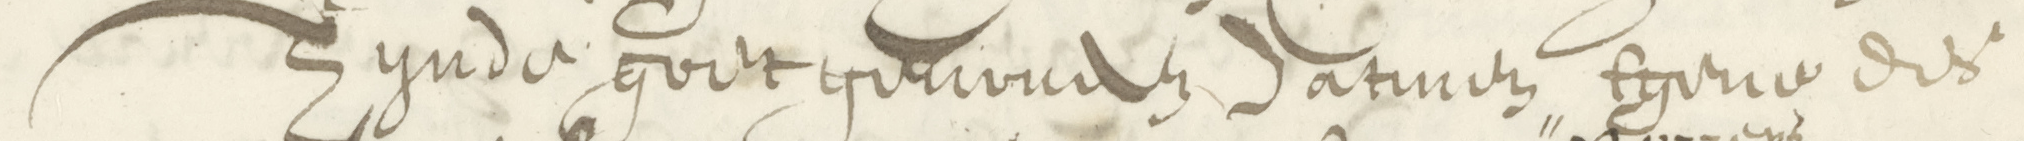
Zynde goetgevonden datmen tgene des
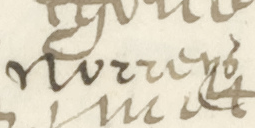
"Norreys.
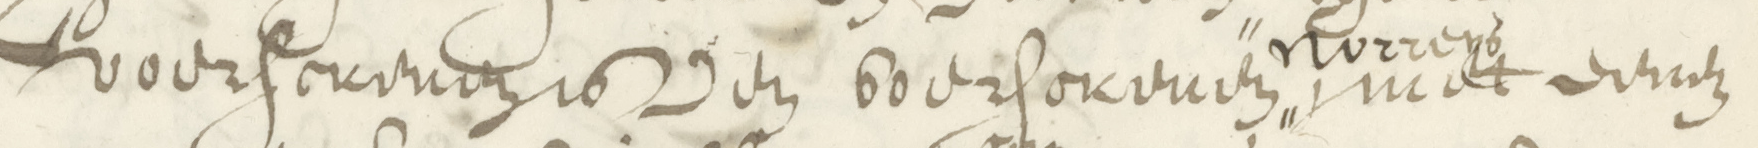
voerscreuen is den voerscreuen,, , met eenen
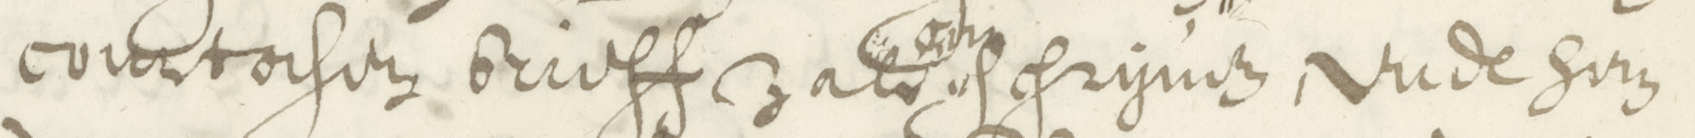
courtoisen brieff zal anschrijven, ende hem
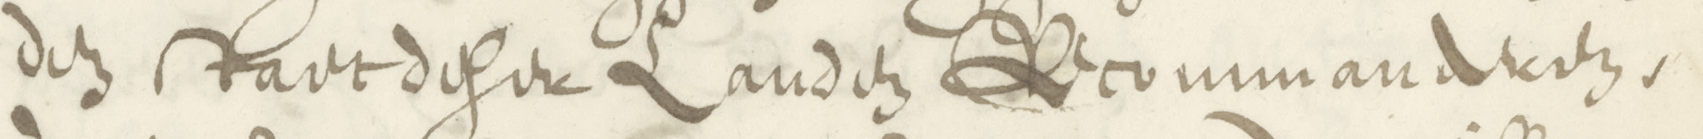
den staet deser Landen Recommanderen,
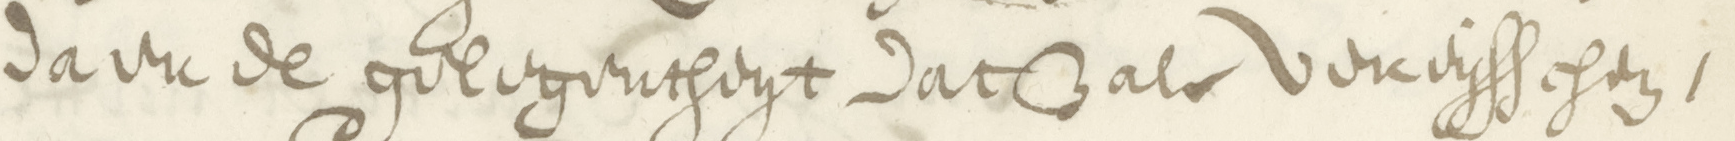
daer de gelegentheyt dat zal vereijsschen.
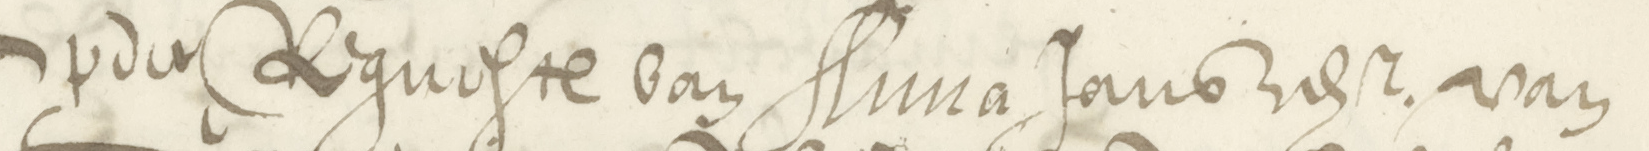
Opde Requeste van Anna Janszdr. van
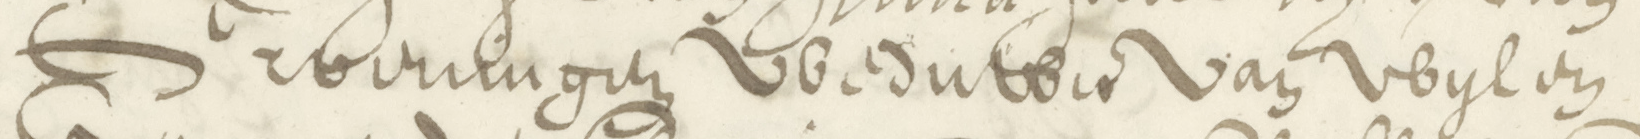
Groningen weduwe van wylen
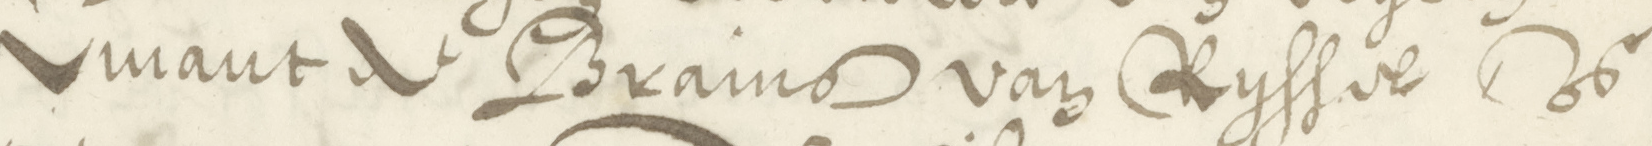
Qinant de Brains van Rijssel, Is
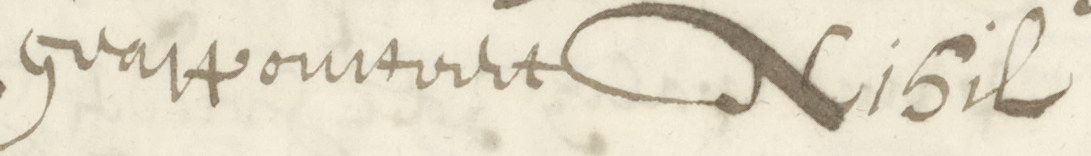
geappointeert Nihil
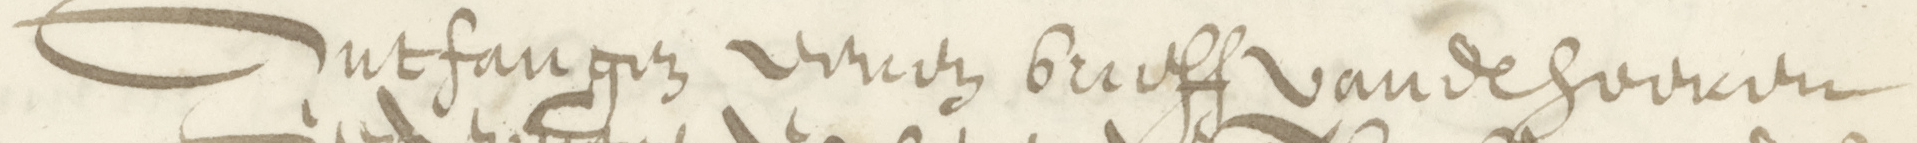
Ontfangen eenen brieff vande heeren
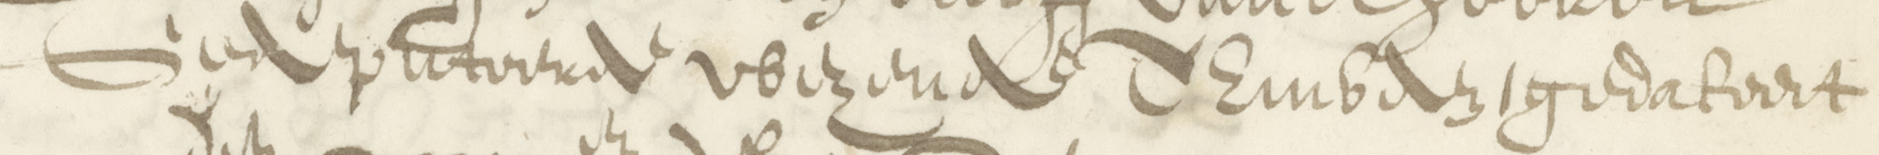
Gedeputeerde wezende T Embden gedateert
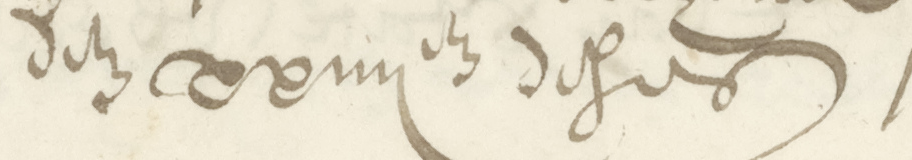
den xxiijen. deses,
